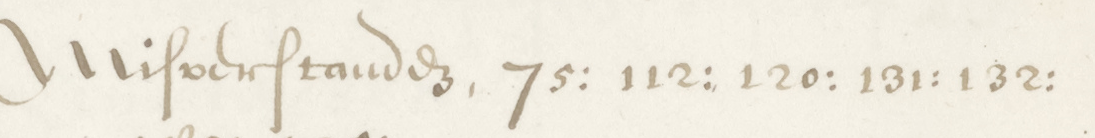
Misverstanden, 75: 112: 120: 131: 132:
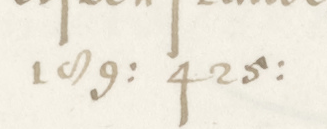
189: 425:
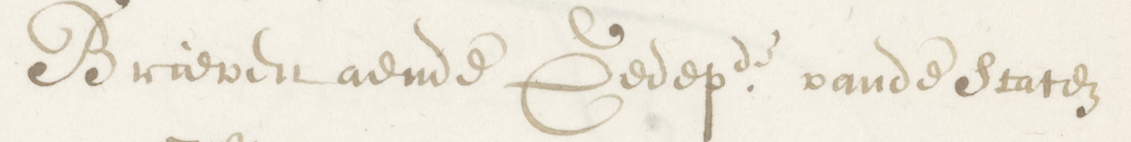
Brieven aende Gedepde. vande Staten
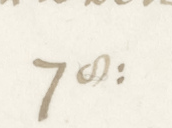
78:
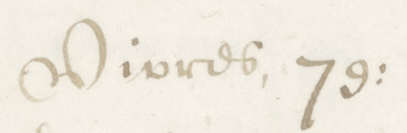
Vivres, 79:
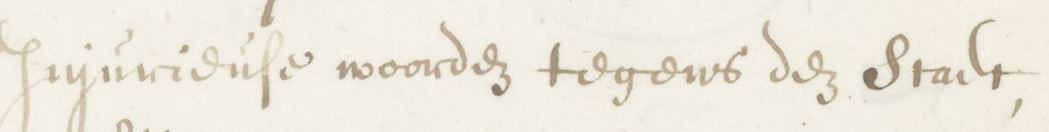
Injurieuse woorden tegens den Staet,
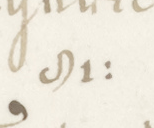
81:
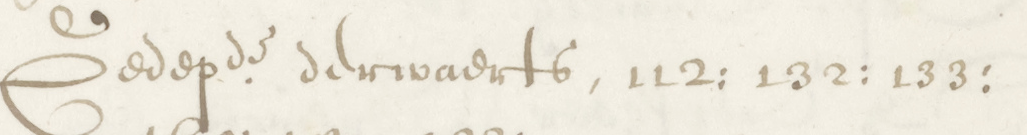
Gedepde. derwaerts, 112: 132: 133:
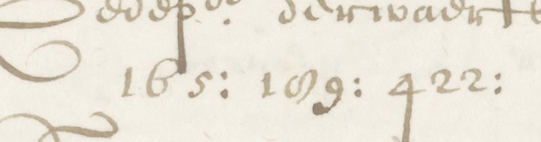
165: 189: 422:
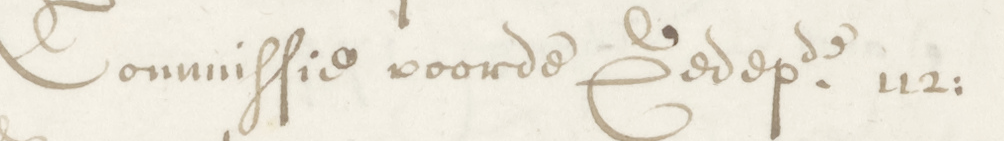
Commissie voorde Gedepde. 112:
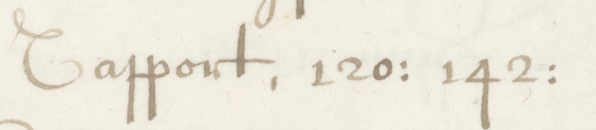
Rapport, 120: 142:
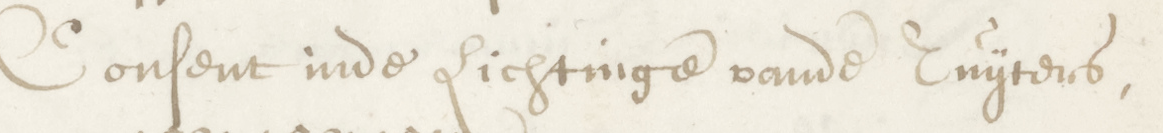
Consent inde Lichtinge vande Ruijters,
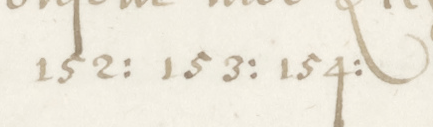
152: 153: 154:
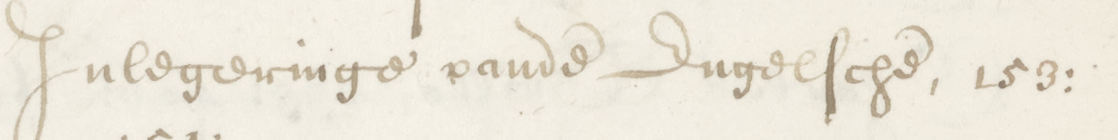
Inlegeringe vande Engelsche, 153:
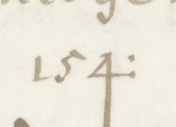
154:
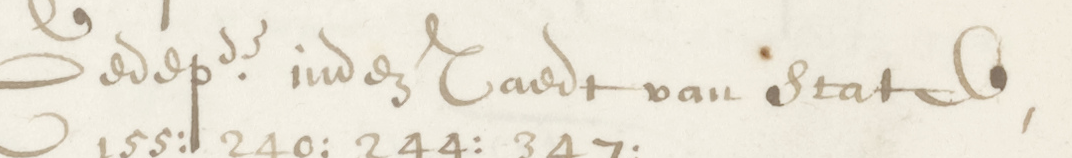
Gedepde. inden Raedt van State,
